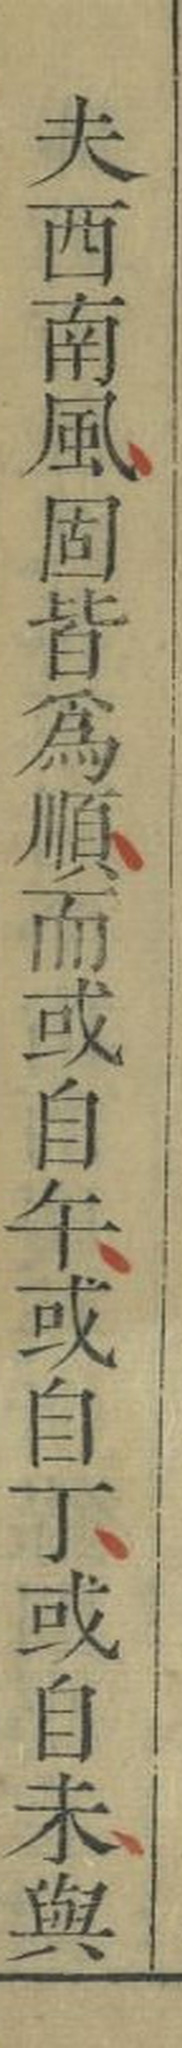夫西南風固皆爲順而或自午或自丁或自未與

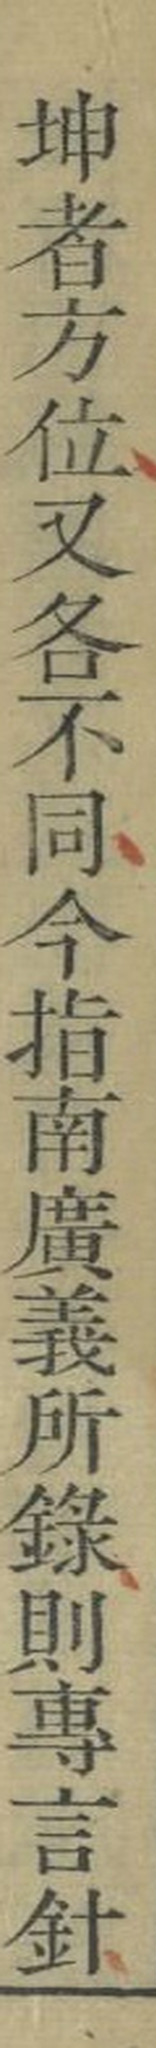坤者方位又各不同今指南廣義所錄則專言針
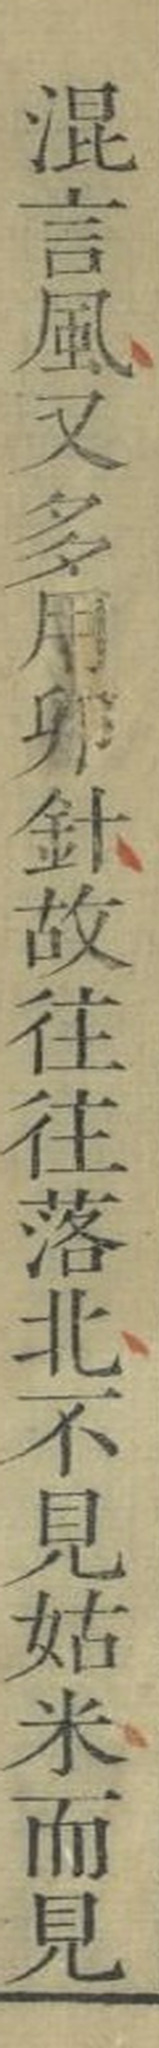混言風又多用卯針故往往落北不見姑米而見
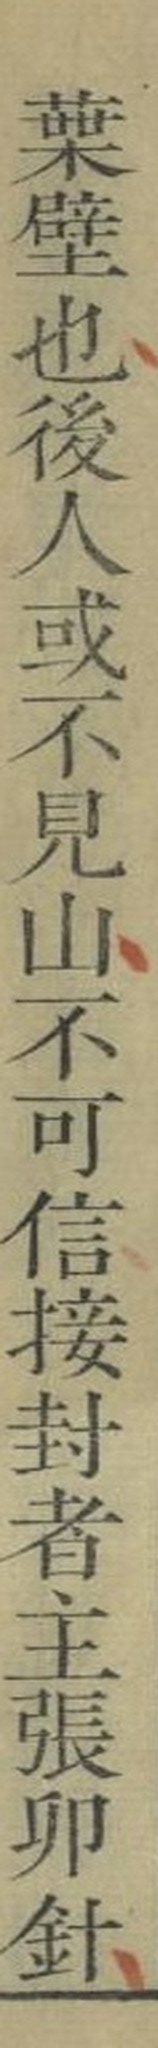葉壁也後人或不見山不可信接封者主張卯針
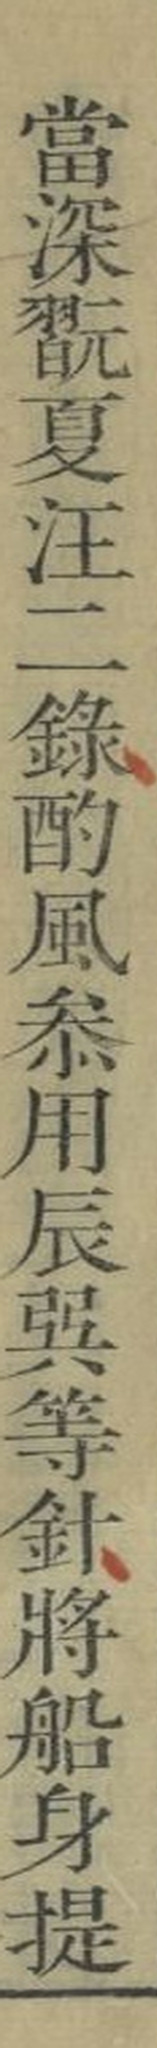當深翫夏汪二錄酌風叅用辰㢲等針將船身提
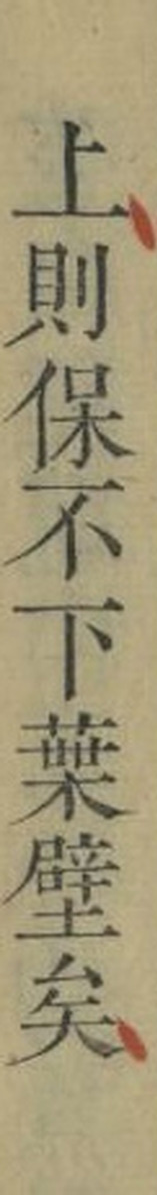上則保不下葉壁矣
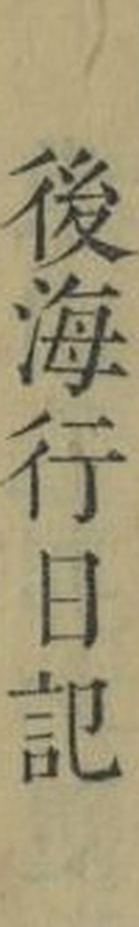後海行日記
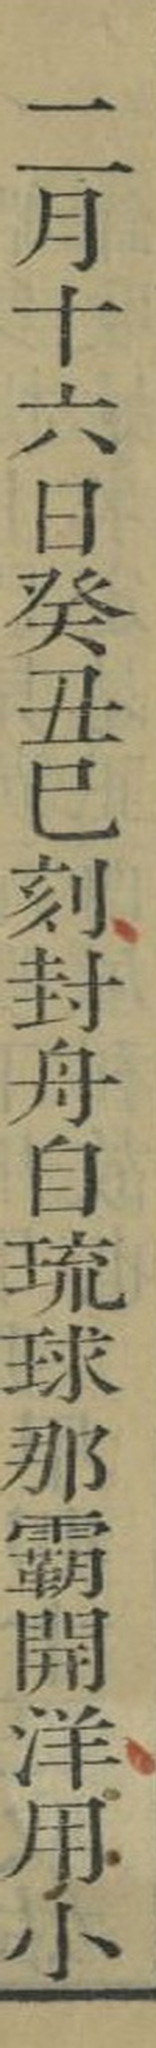二月十六日癸丑巳刻封舟自琉球那霸開洋用小
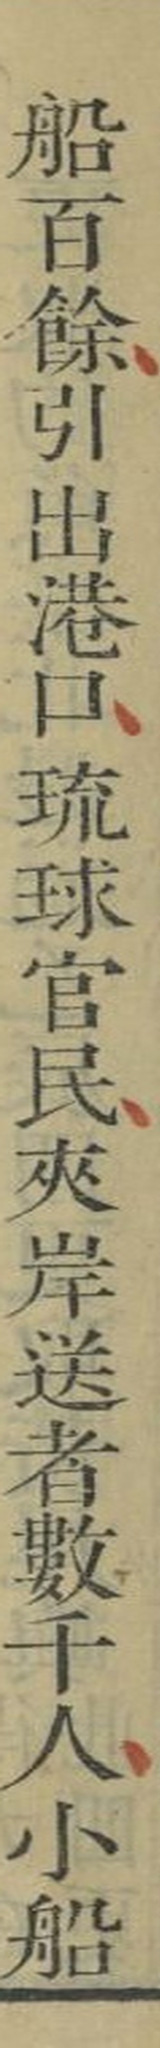船百餘引出港口琉球官民夾岸送者數千人小船
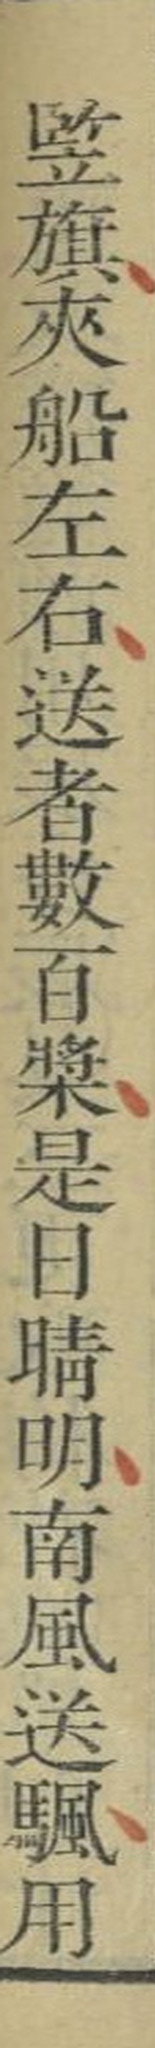堅旗夾船左右送者數百槳是日晴明南風送颿用
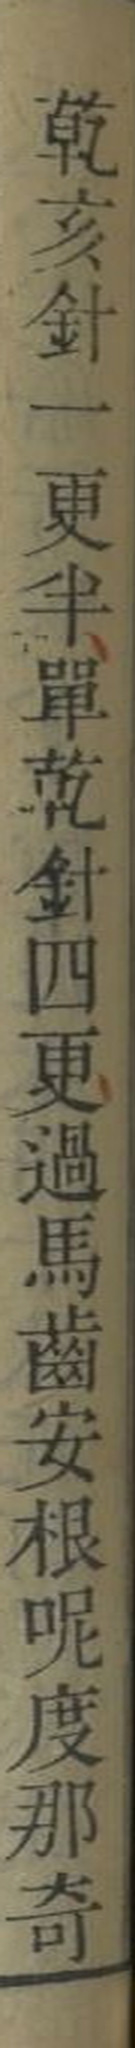乾亥針一更半單乾針四更過馬齒安根呢度那奇
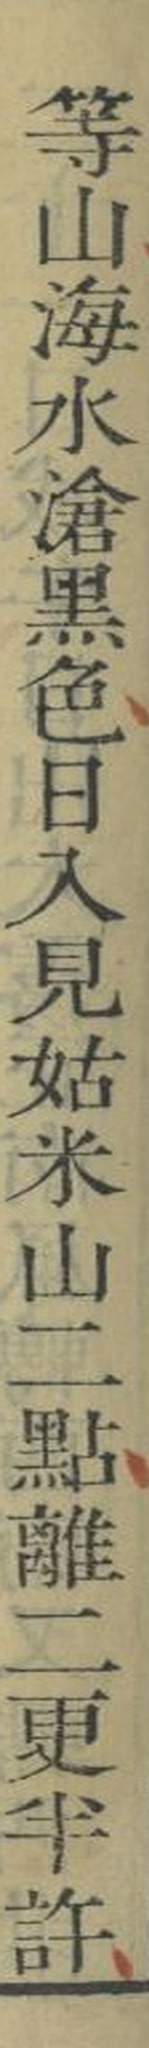等山海水滄黑色日入見姑米山二點離二更半許
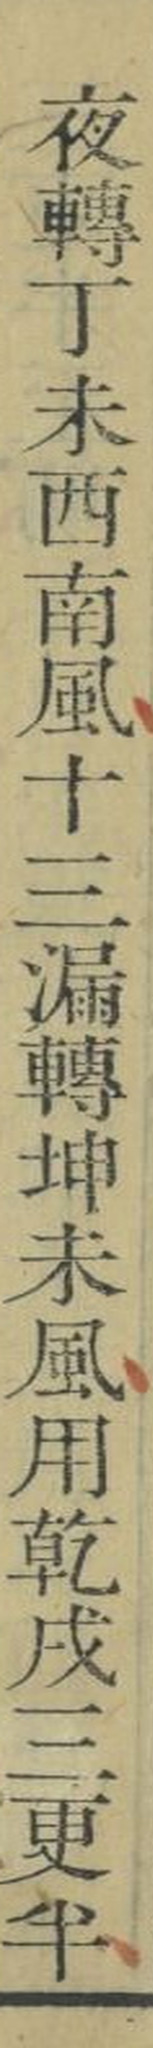夜轉丁未西南風十三漏轉坤未風用乾戌三更半
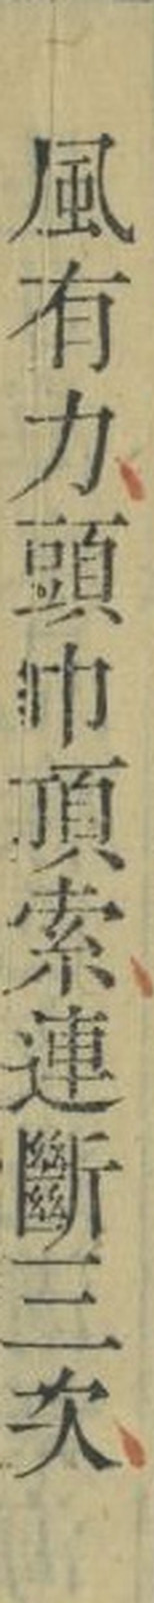風有力頭巾頂索連斷三次
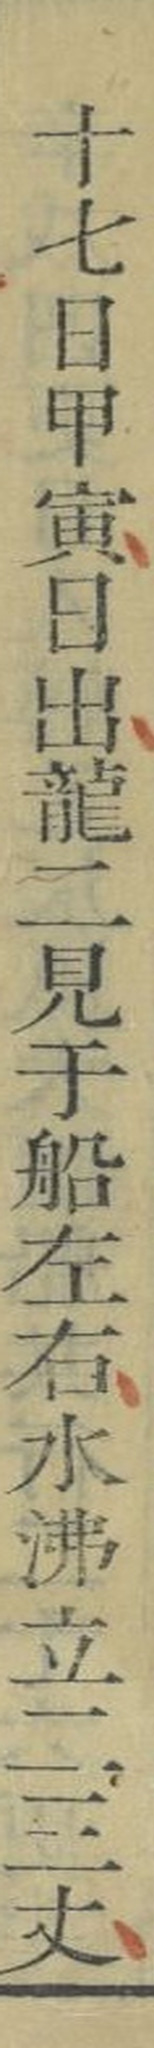十七日甲寅日出龍二見于船左右水沸立二三丈
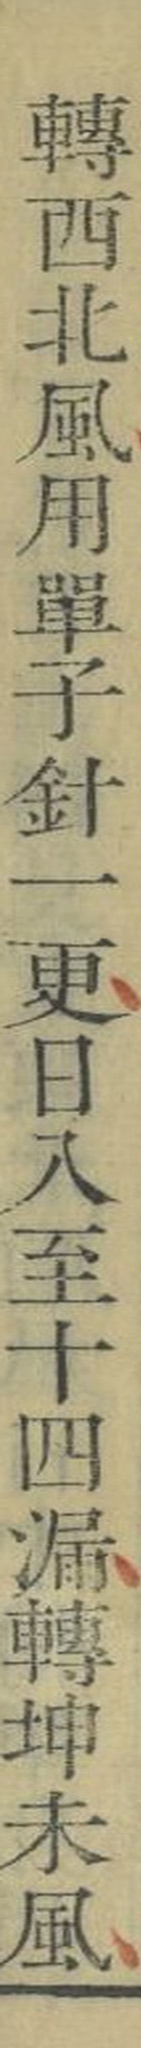轉西北風用單子針一更日入至十四漏轉坤未風
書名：中山伝信録 巻一、巻二
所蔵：University of the Ryukyus Library
